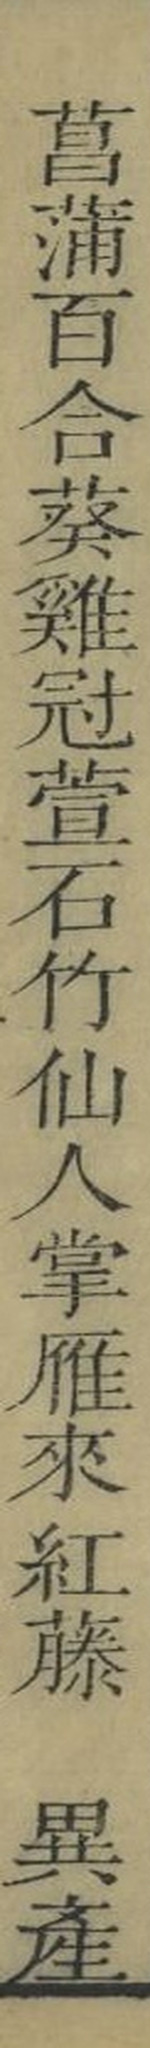菖蒲百合葵鶏冠萱石竹仙人掌雁来紅藤異産
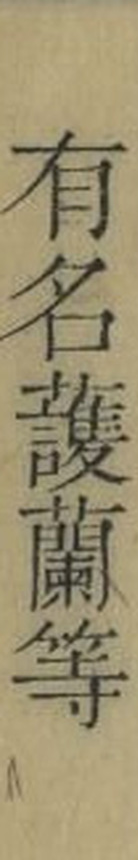有名護蘭等

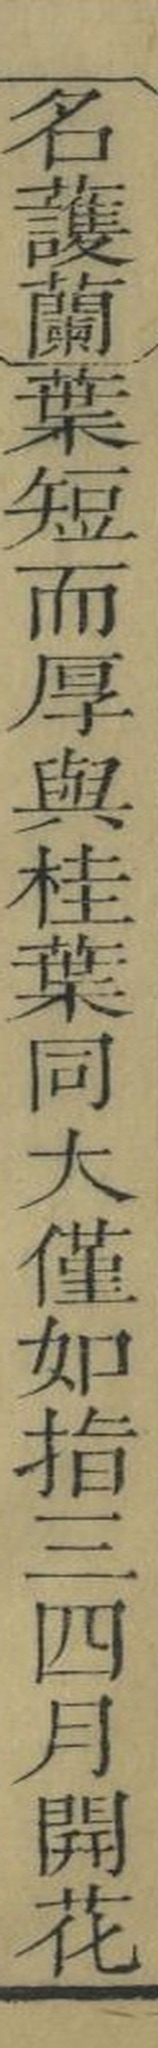[名護蘭]葉短而厚与桂葉同大僅如指三四月開花
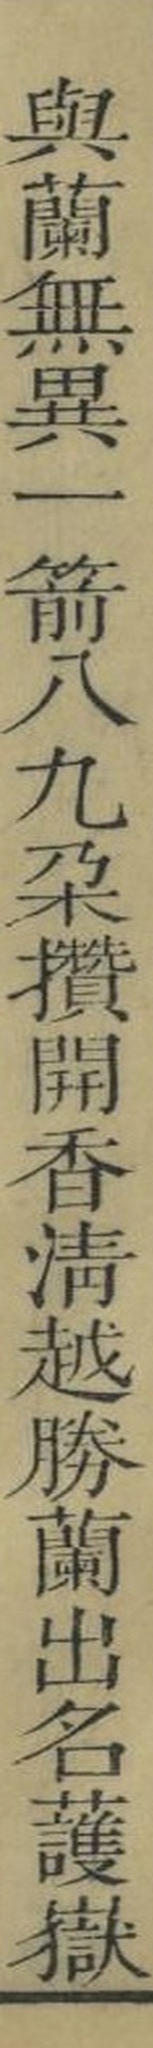与蘭無異一箭八九朶攢開香清越勝蘭出名護岳
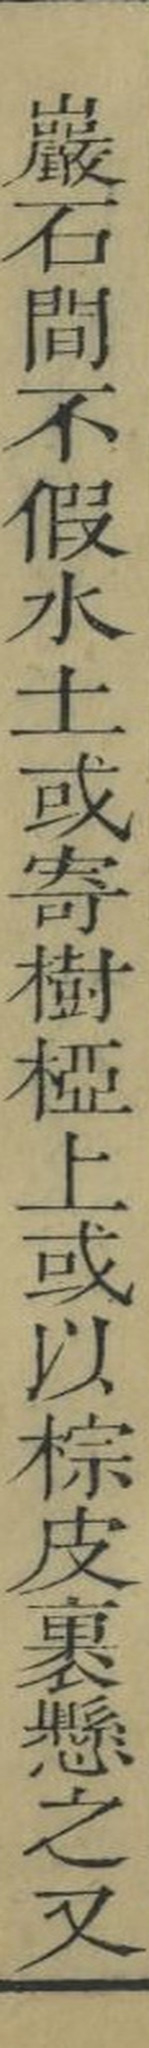巌石間不假水土或寄樹椏上或以棕皮裹懸之又
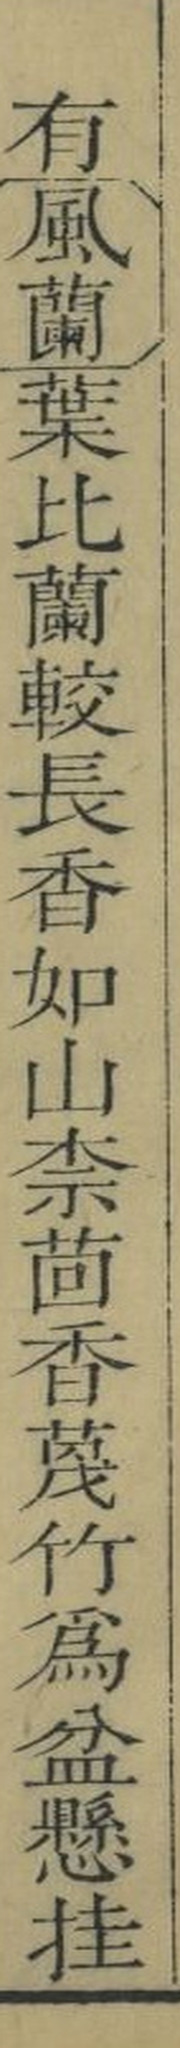有[風蘭]葉比蘭較長香如山奈茴香蔑竹為盆懸挂
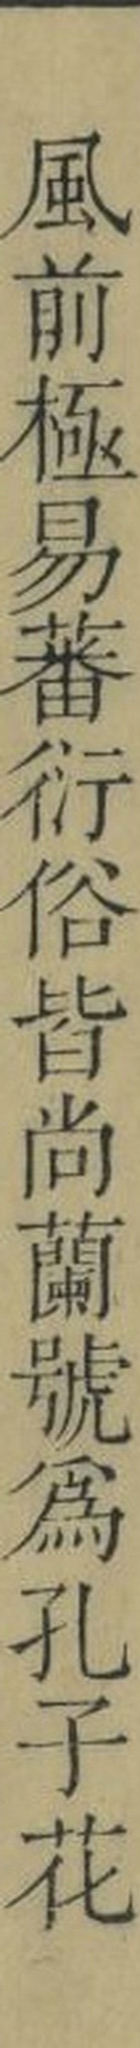風前極易蕃衍俗皆尚蘭号為孔子花
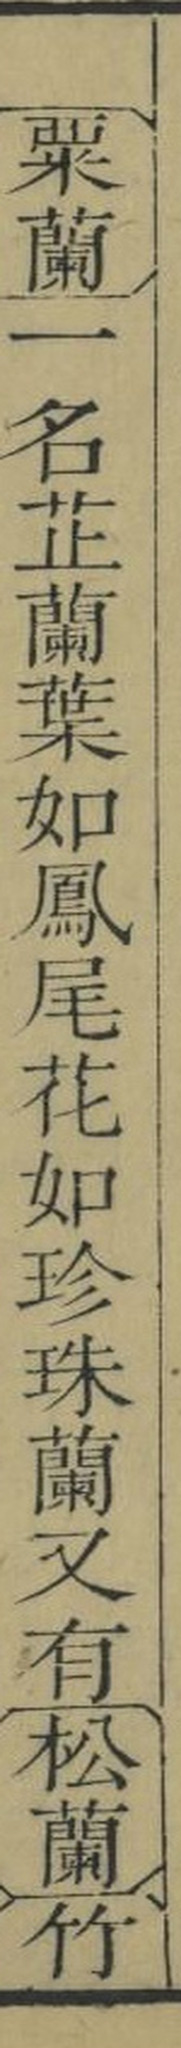[粟蘭]一名芷蘭葉如鳳尾花如珍珠蘭又有[松蘭][竹
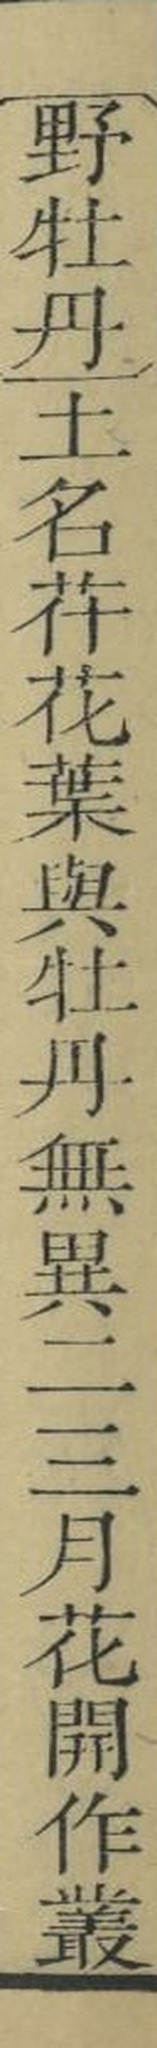[野牡丹]土名𦬯花葉与牡丹無異二三月花開作叢
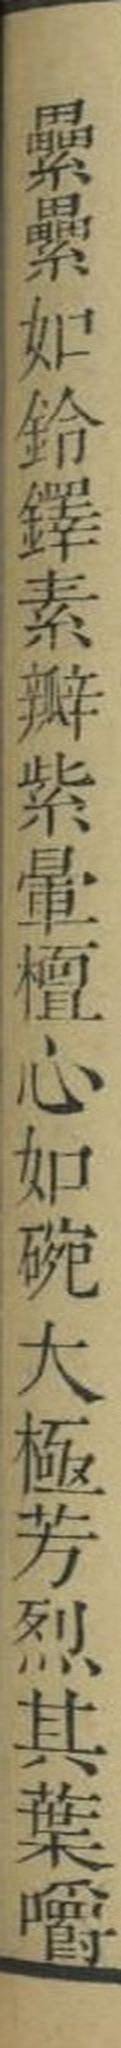纍纍如鈴鐸素弁紫暈檀心如碗大極芳烈其葉嚼
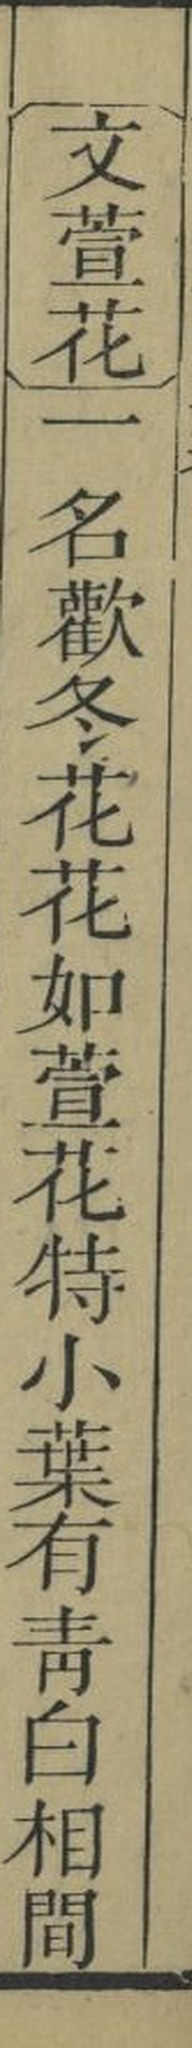[文萱花]一名歓冬花花如萱花特小葉有青白相間
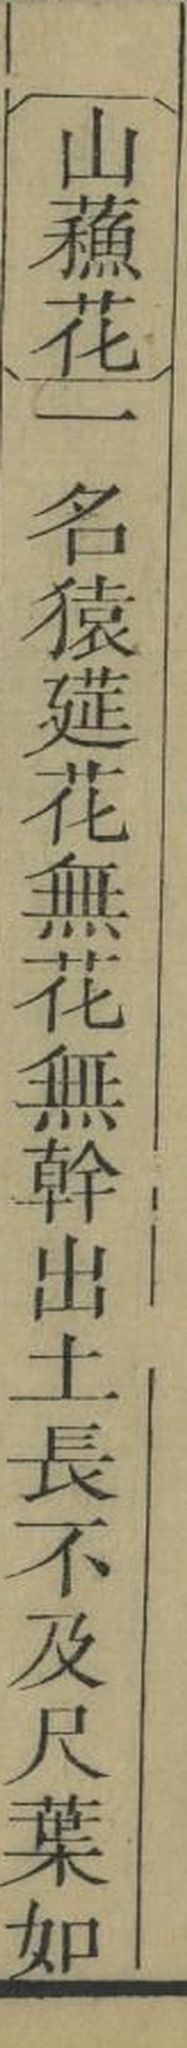[山蘓花]一名猿莚花無花無幹出土長不及尺葉如
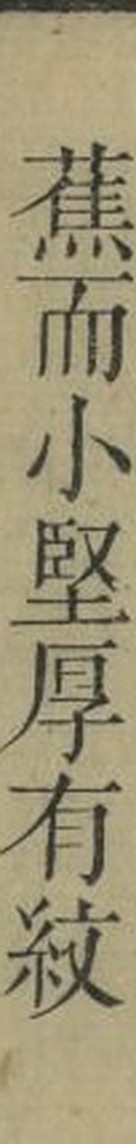蕉而小堅厚有紋
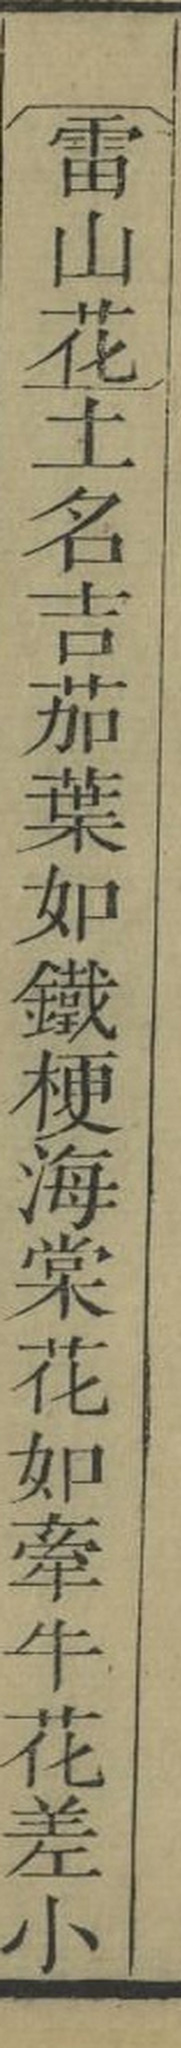[雷山花]土名吉茄葉如鉄梗海棠花如牽牛花差小
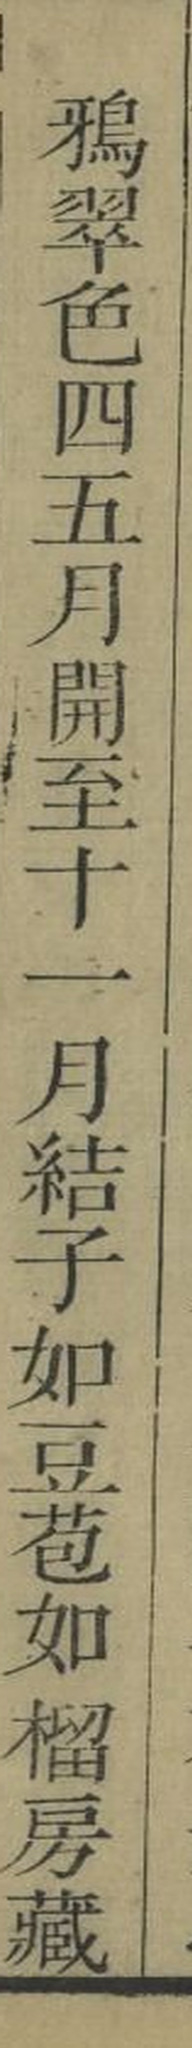鴉翠色四五月開至十一月結子如豆苞如榴房蔵

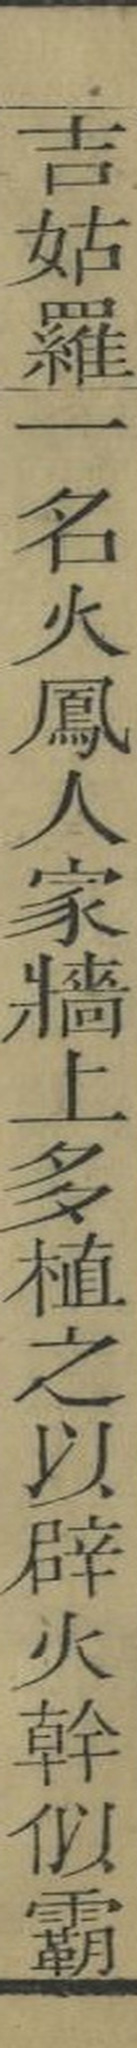[吉姑羅]一名火鳳人家牆上多植之以辟火幹似覇
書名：中山伝信録 巻六
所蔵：University of the Ryukyus Library
